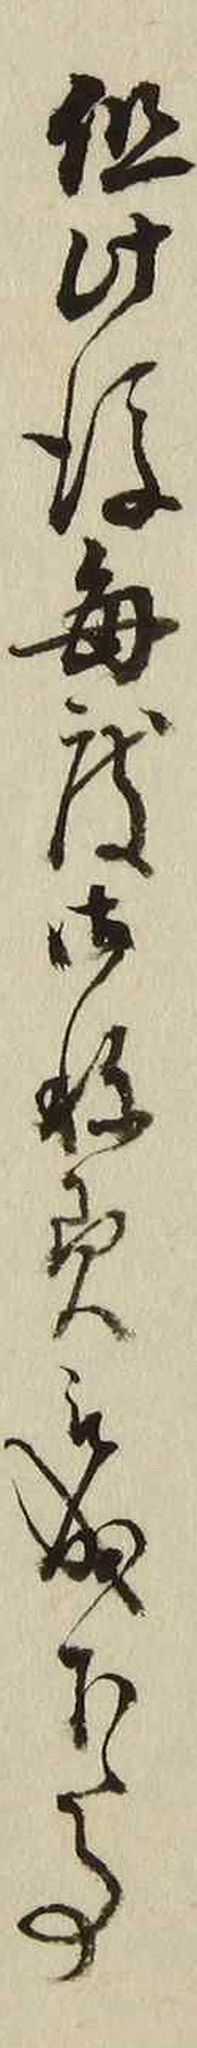但此後毎度御称美被成下候事
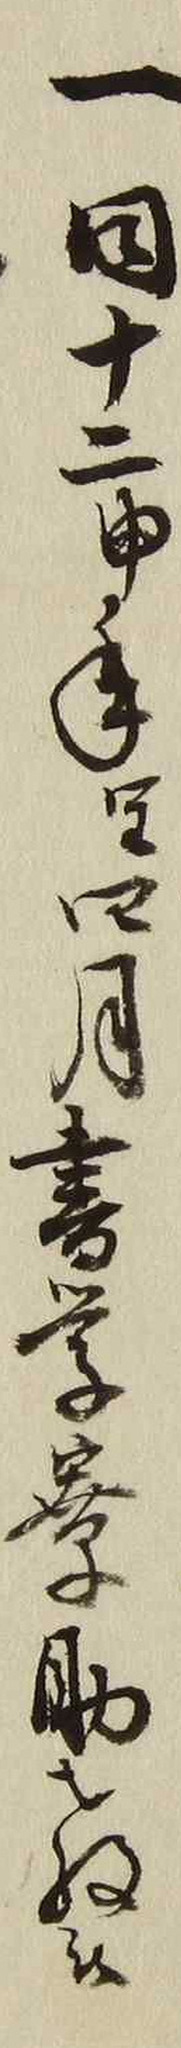一同十二申年閏四月書学寮教被
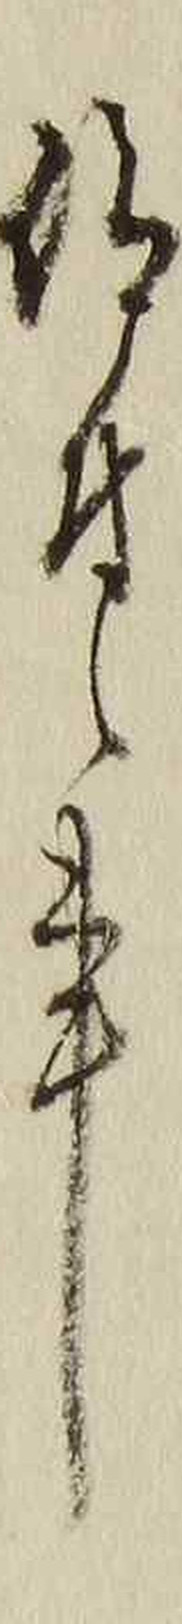仰付候事
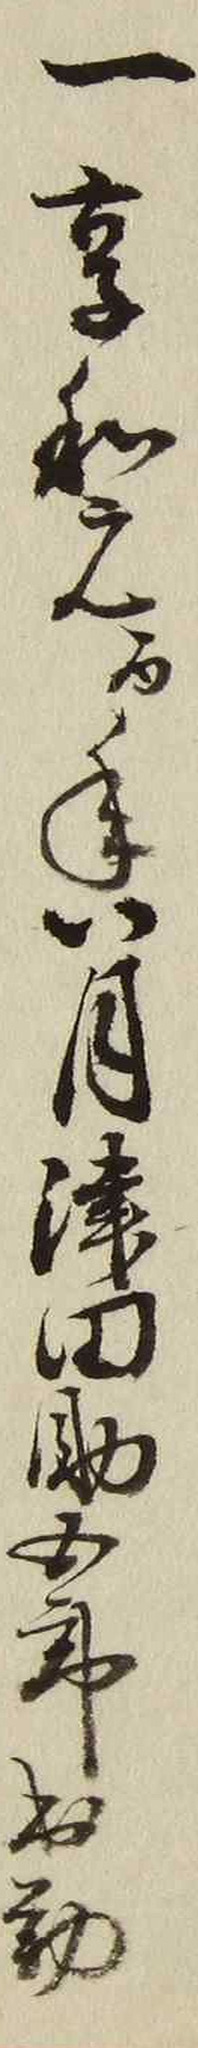一享和元酉年八月津田助五郎出勤
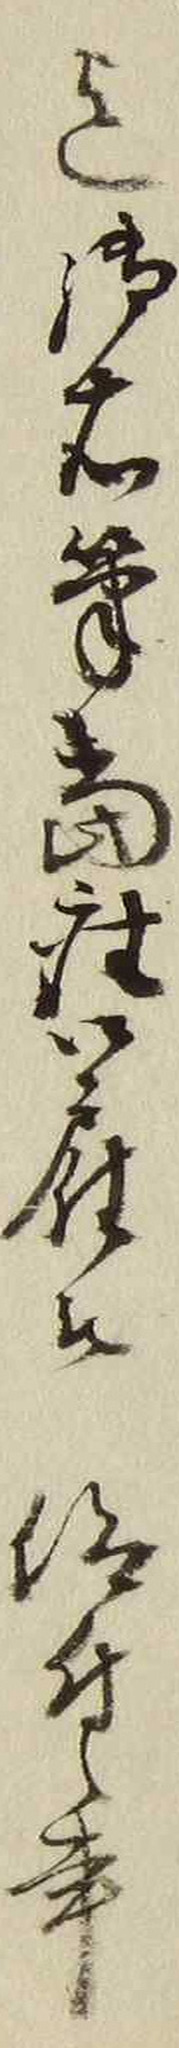迄御右筆当座御雇被仰付候事
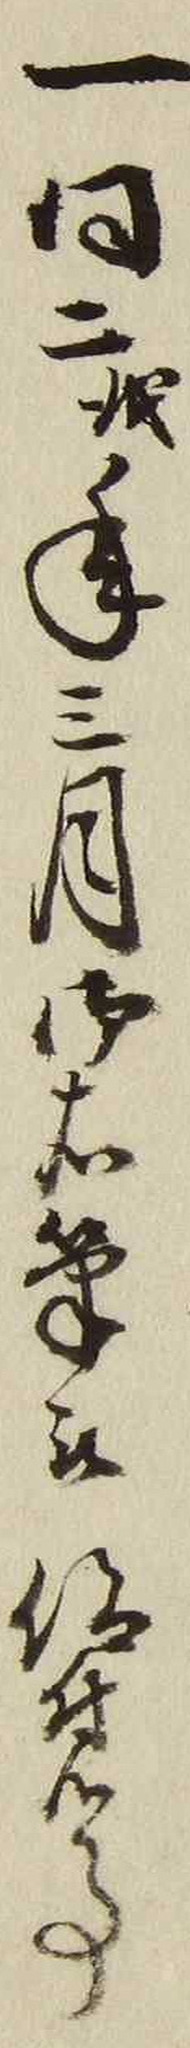一同二戌年三月御右筆被仰付候事
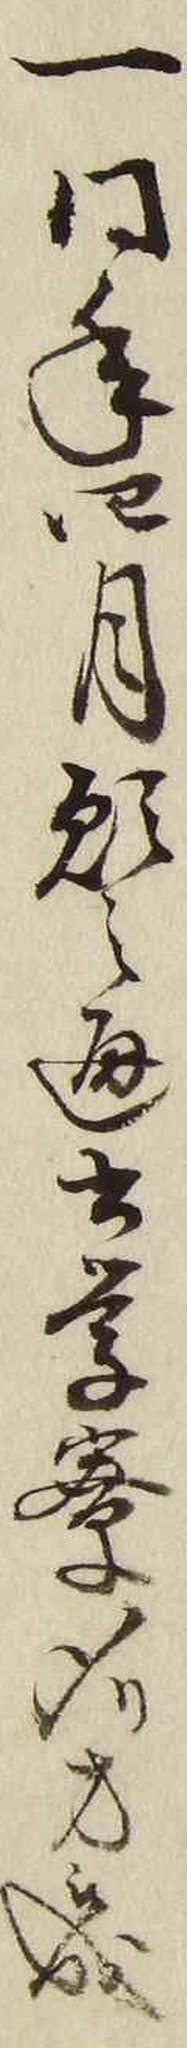一同年四月願之通書学寮〆り方被成

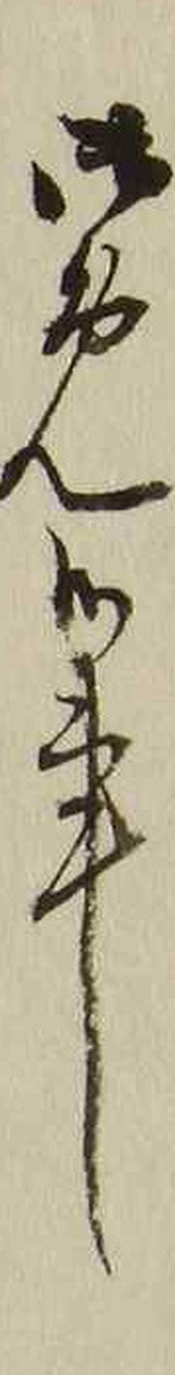御免候事
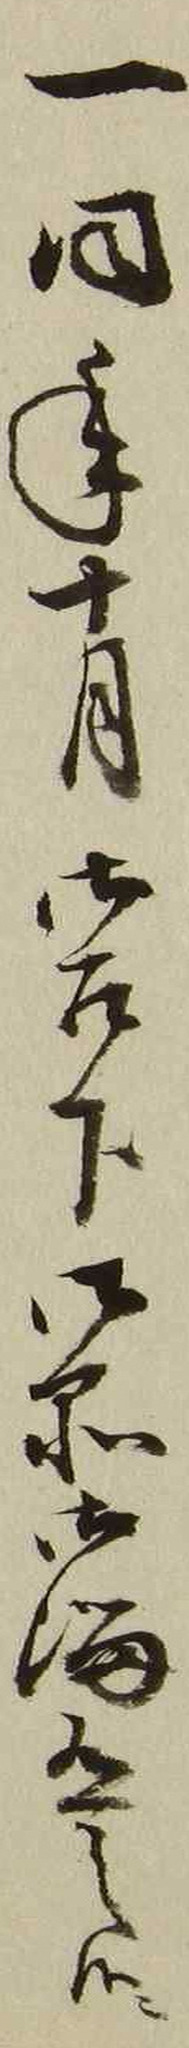一同年十月御召下御品御溜有之候ニ
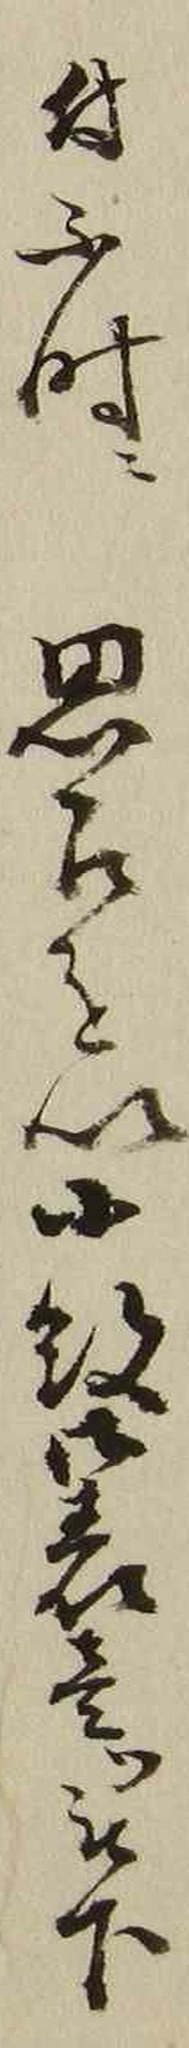付不時ニ思召を以小紋御表壱ツ被下
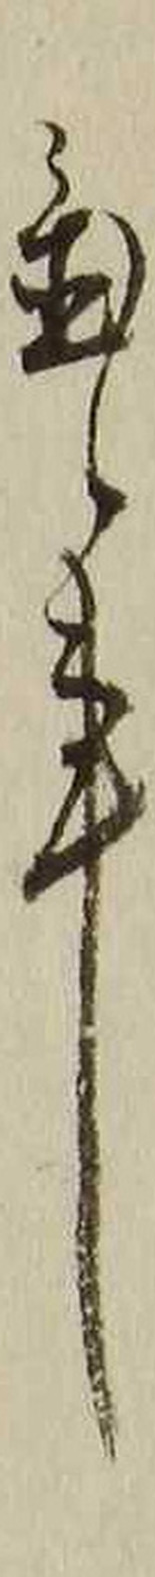置候事
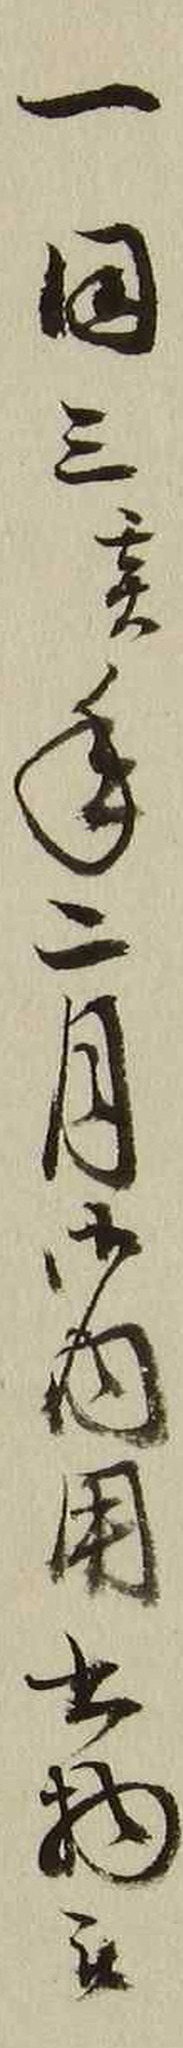一同三亥年二月御内用書物被
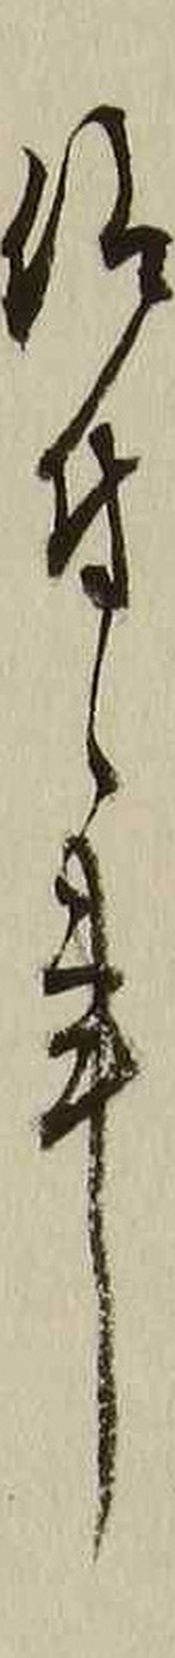仰付候事
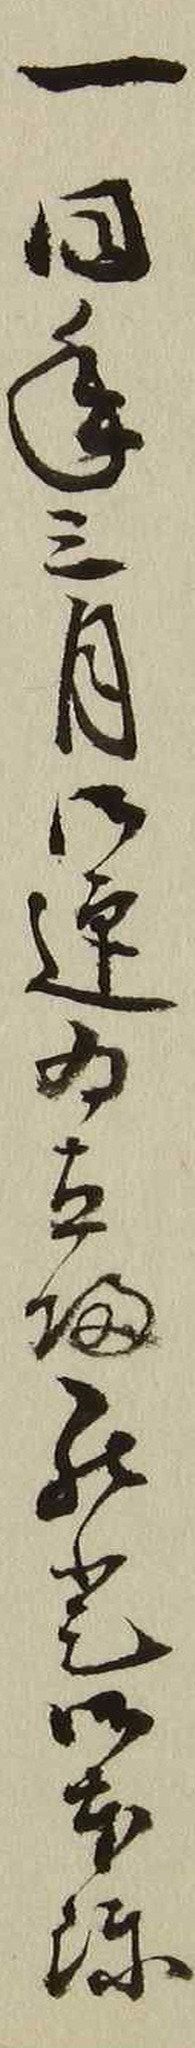一同年三月御迎為立帰罷登御本陣
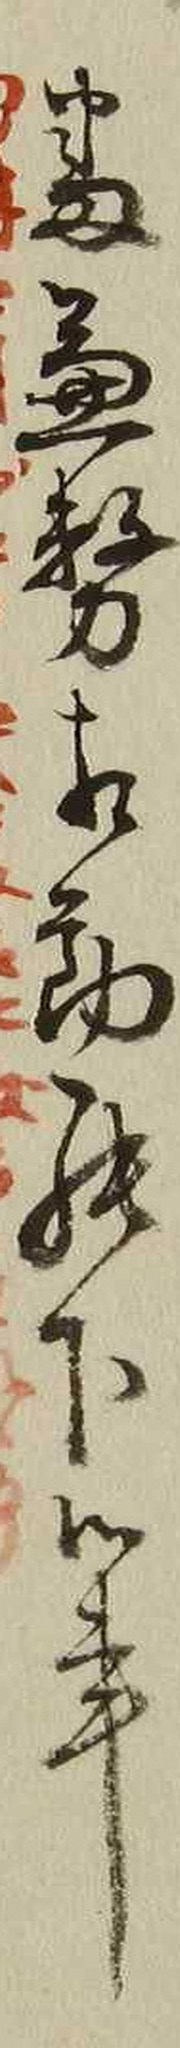番兼務相勤罷下候事
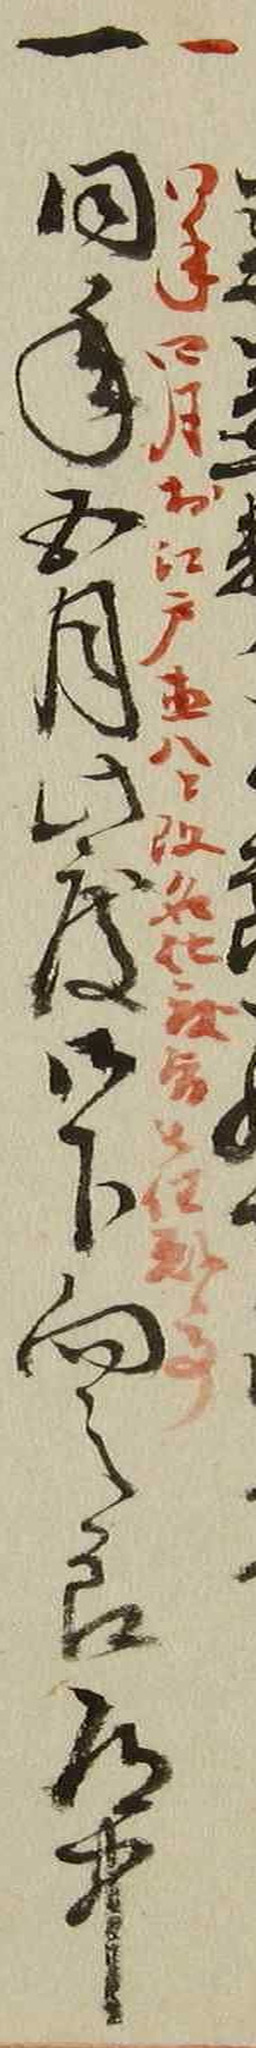一同年五月此度御下向之節道中
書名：諸士系譜　巻之36　は之部4
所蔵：会津若松市立会津図書館
